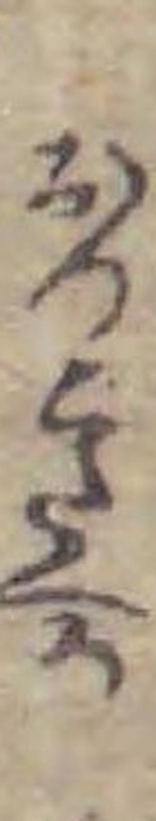おつこさへか
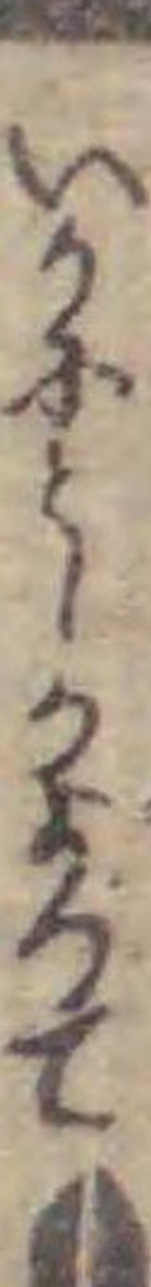いかにとしかよつて
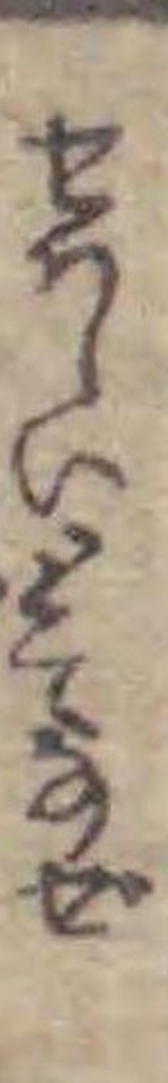せはしいとてなぜ
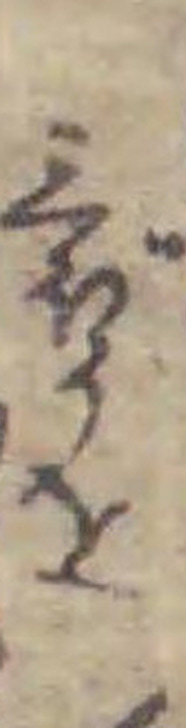三ぼうを
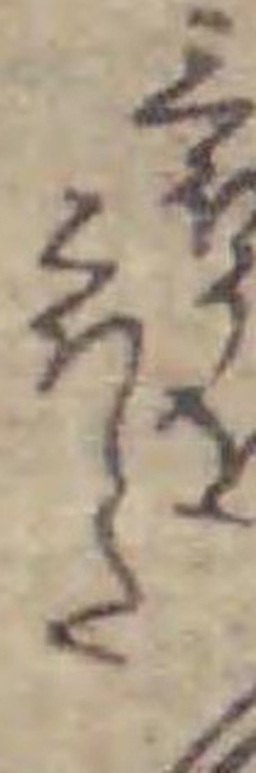こはした
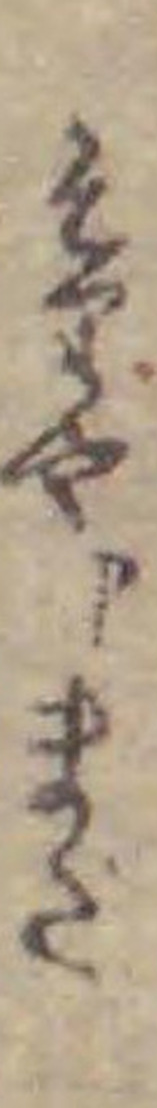そりや
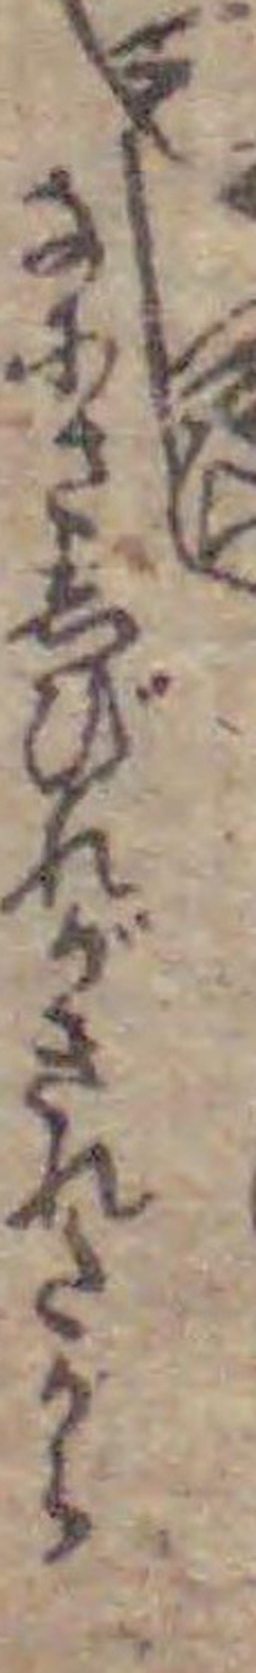なにさしびれがきれたから
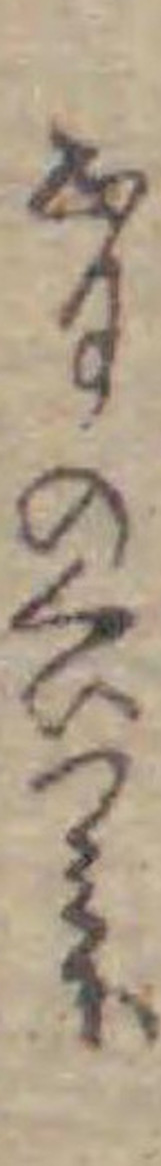正月のくいつみに
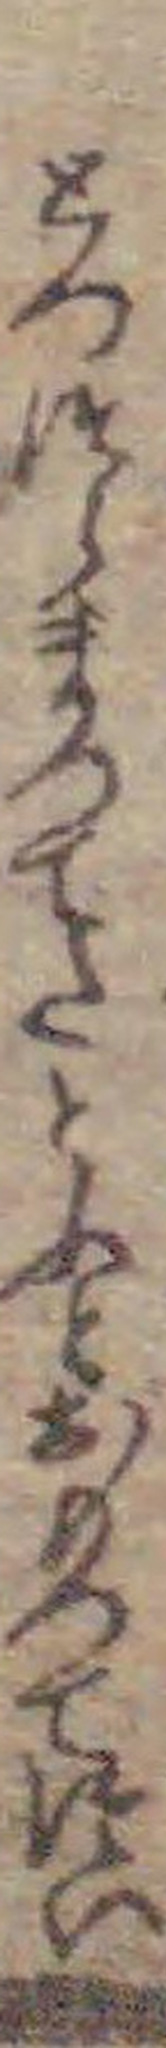とつつらまつてたとふとおもつてつい
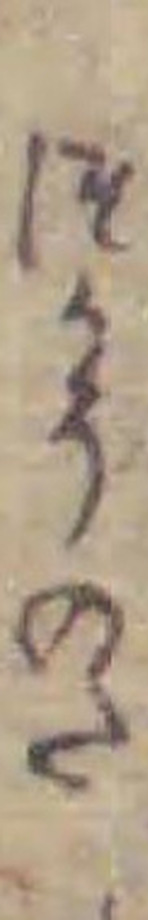つかうのた
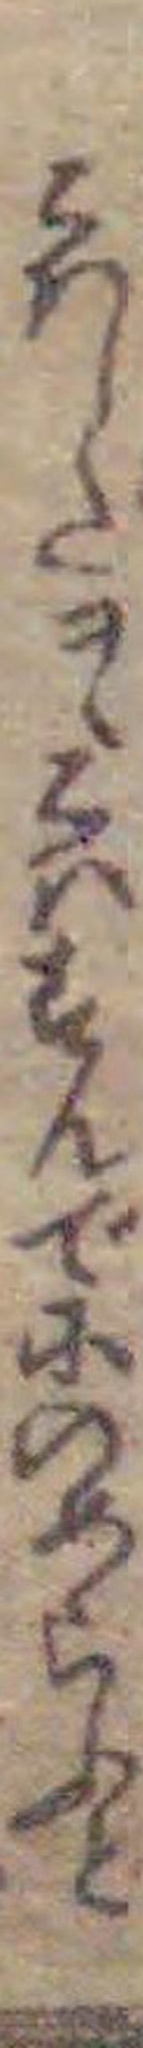こはしたヽこはすんでにのめらふと

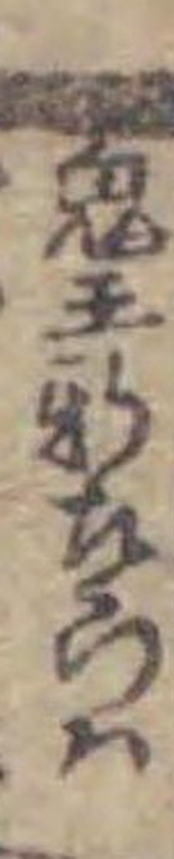鬼王新左衛門は
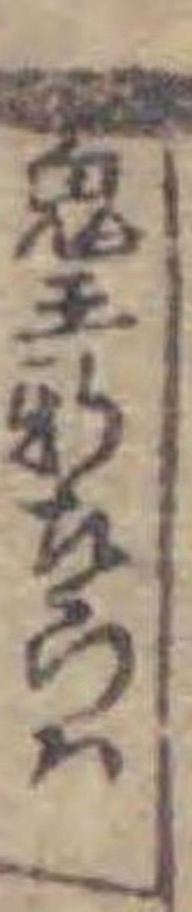鬼王新左衛門は
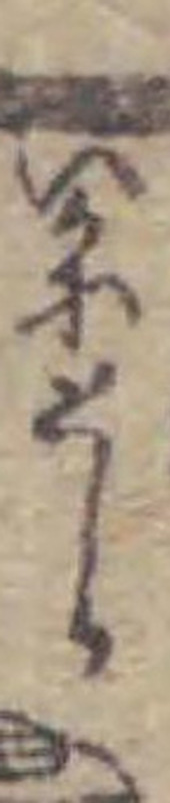いかにとしか
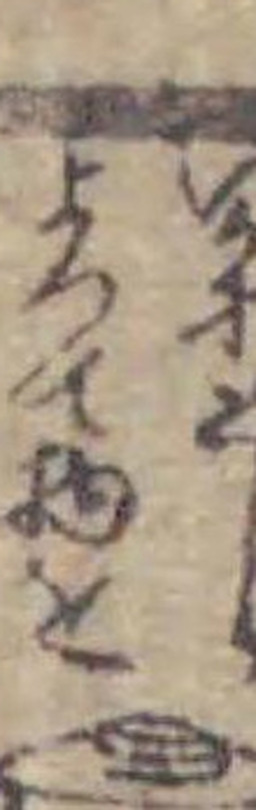よつて物を
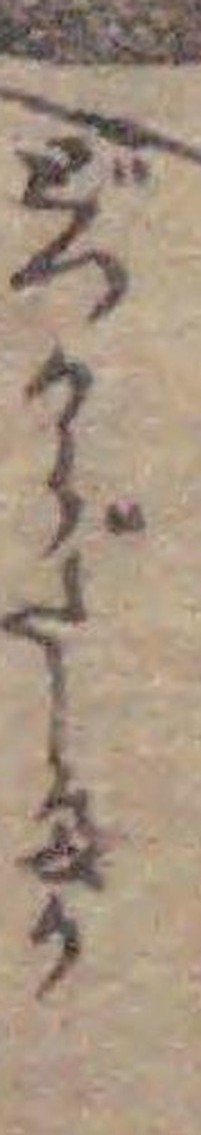どつからだしたか
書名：年寄之冷水曽我 : 3巻
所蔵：国立国会図書館 National Diet Library, JAPAN
